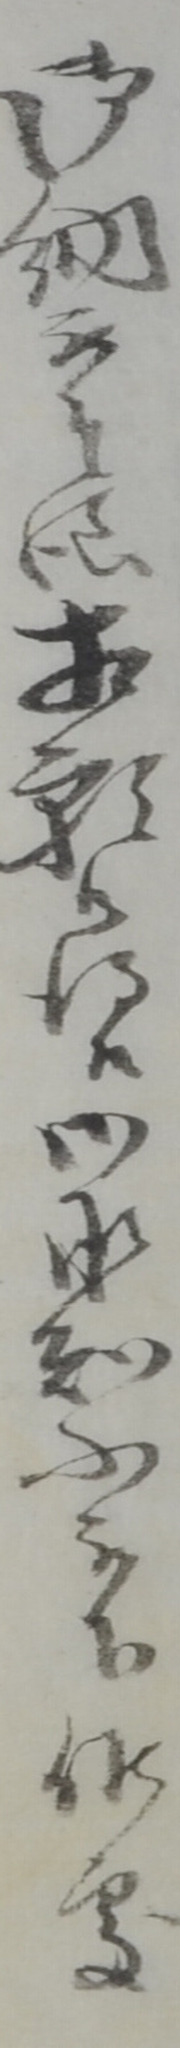御納被下様相願候得共御承知不被下候処

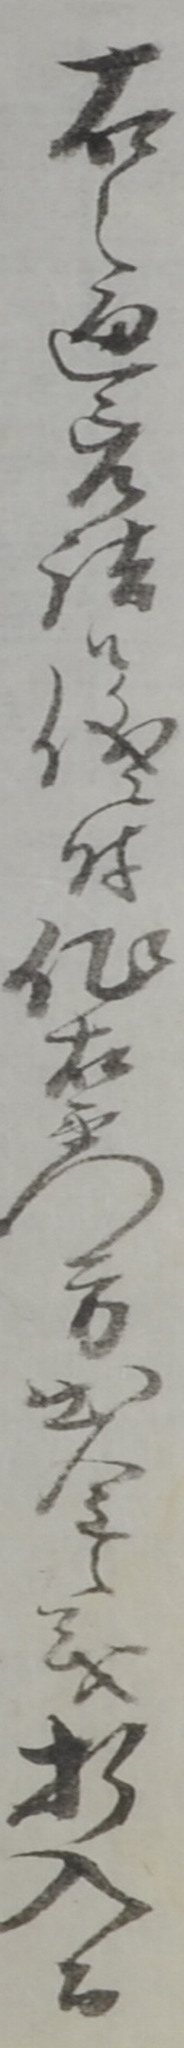右之通差詰候儀ニ付作右衛門方出金之義折入而
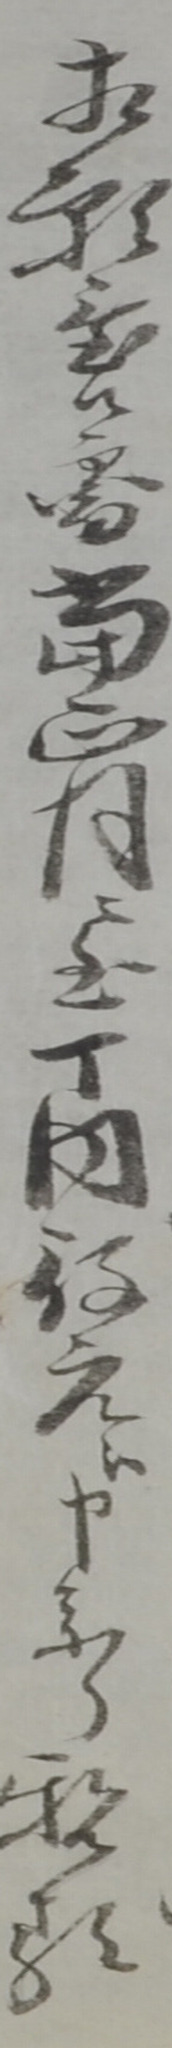相願置候処当正月ニ至町内役元え申参り親類
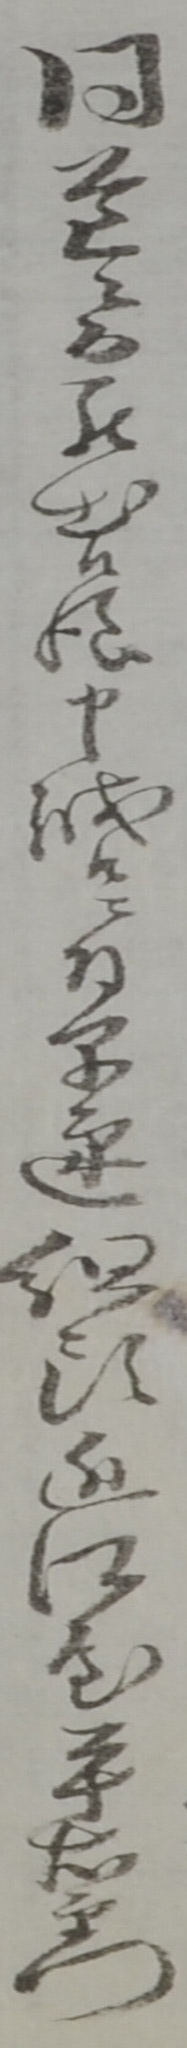同道ニ而罷出候様申越候ニ付早速組頭近江屋平右衛門
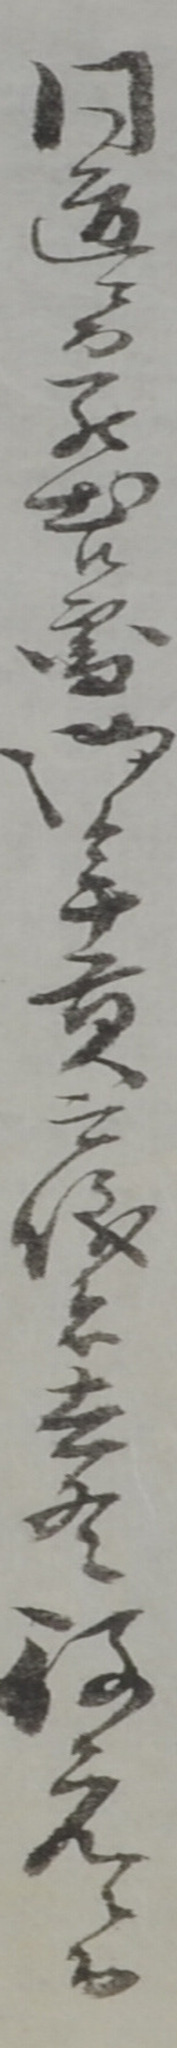同道ニ而罷出候処御年貢之儀者去冬役元ニ而
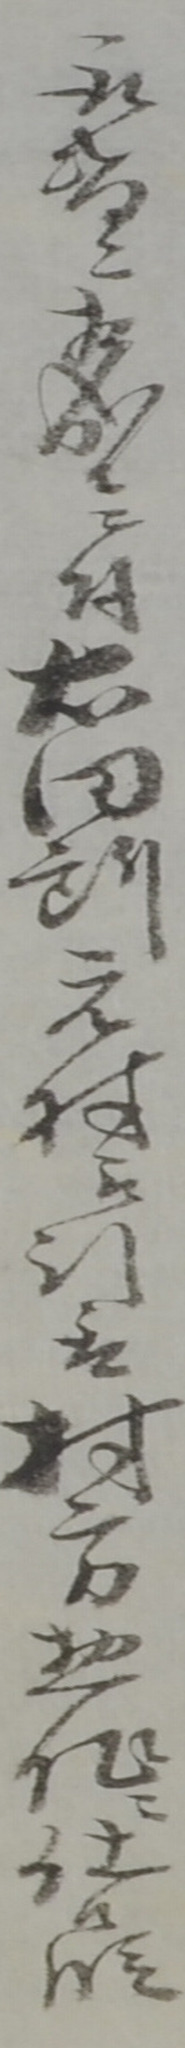取替ニ相成候ニ付右田所元村え引取村方惣作ニ仕候段
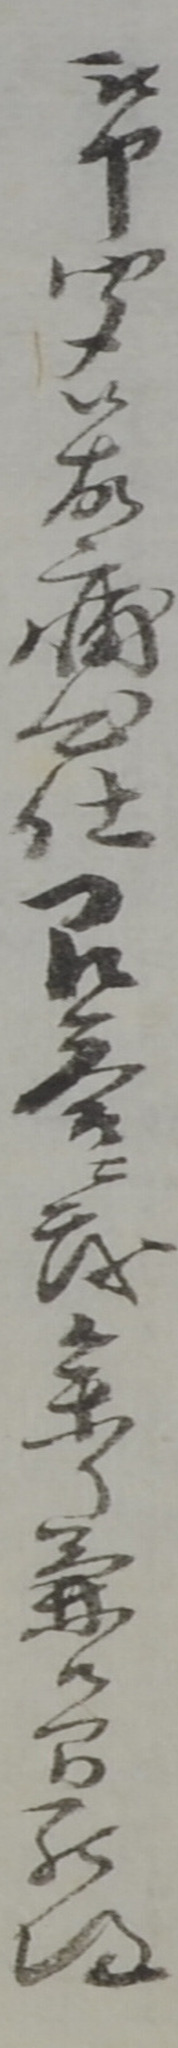被申聞候故痛心仕即答ニも参り兼候間罷帰
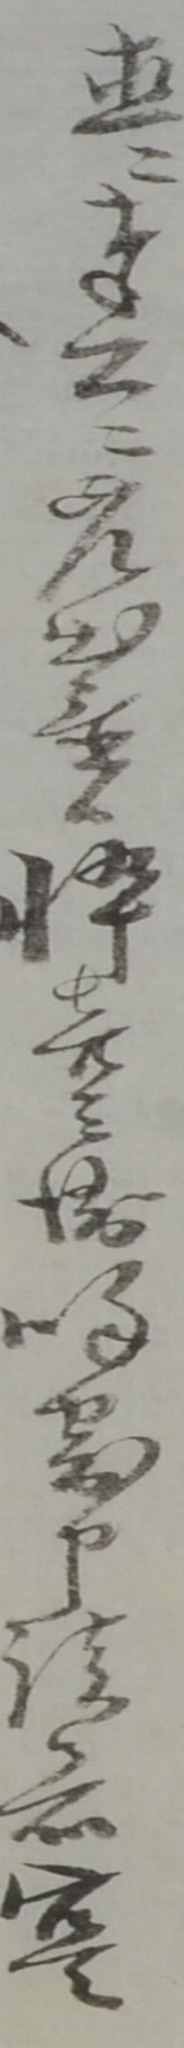直ニ奉公ニ差出置候悴喜兵衛呼寄申談候処寔
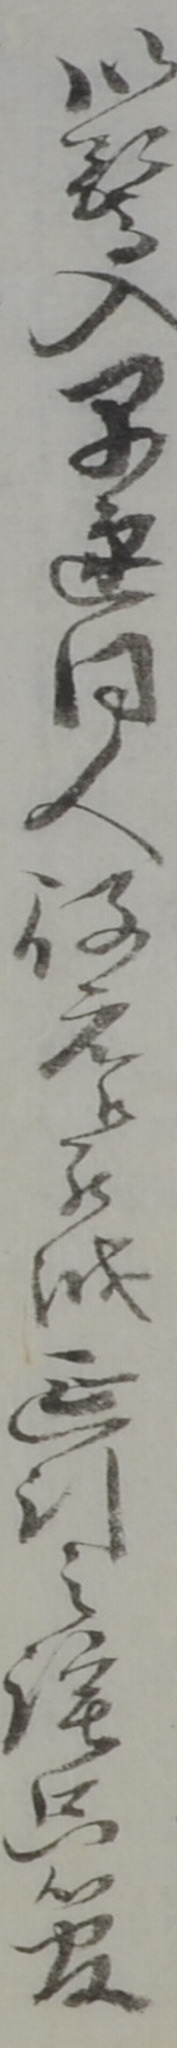以驚入早速同人役元え罷越延引之詫只管
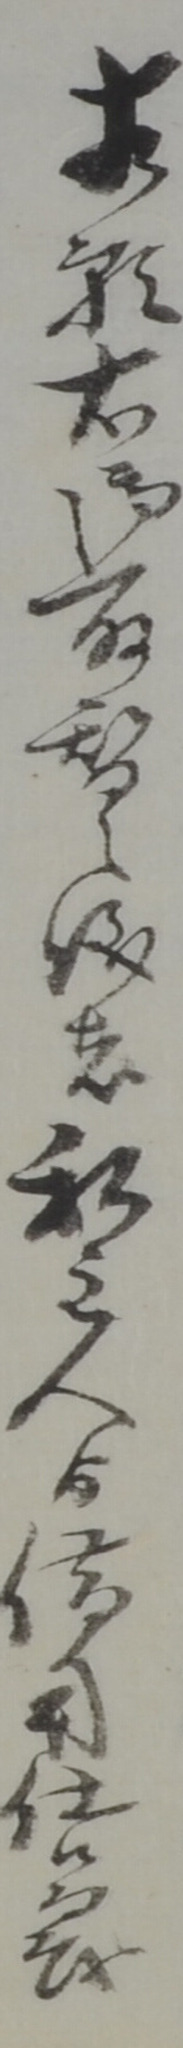相願右御取替之儀者私主人より借用仕候而も
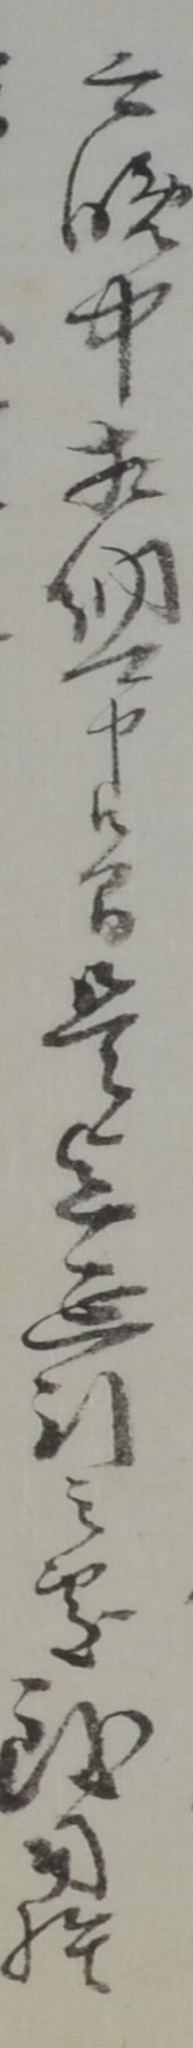今晩中相納可申候間是迄延引之処致用捨
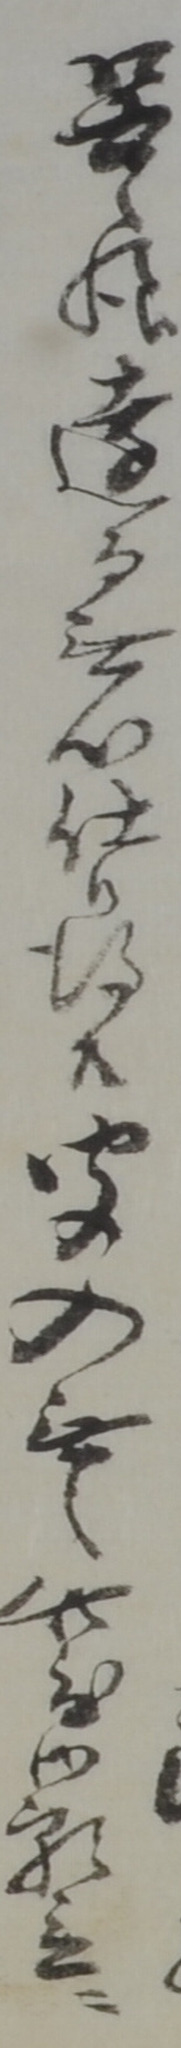呉候様達而無心仕候得共聞入無之此度御願立ニ
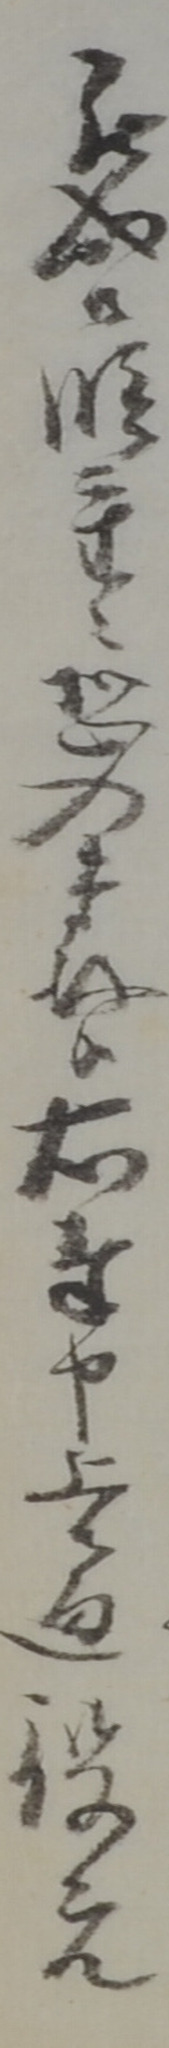罷成候段重々恐入奉存候右奉申上候通役元
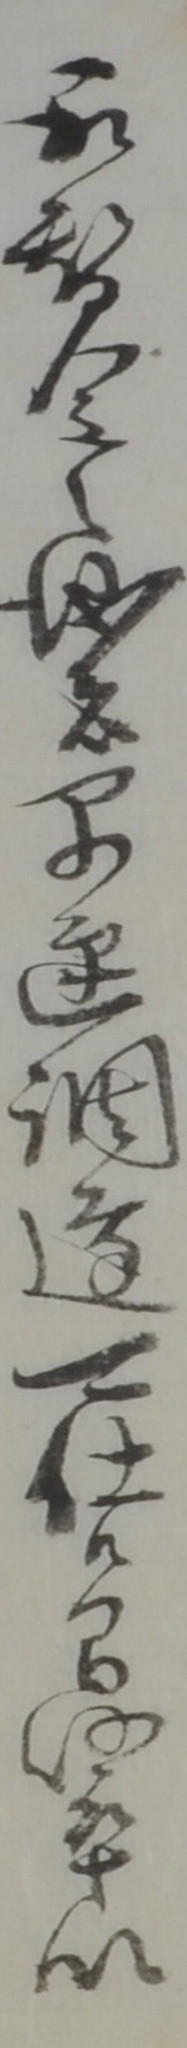取替金之儀者早速調達可仕候間何卒以
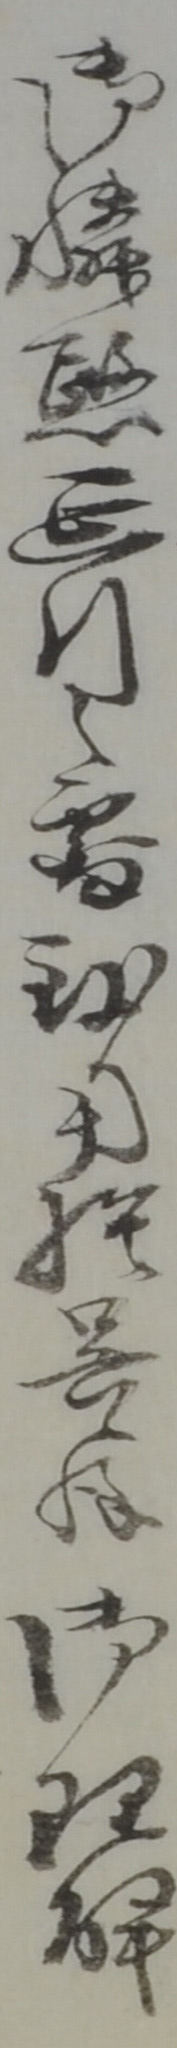御憐愍延引之処致用捨呉候様御理解
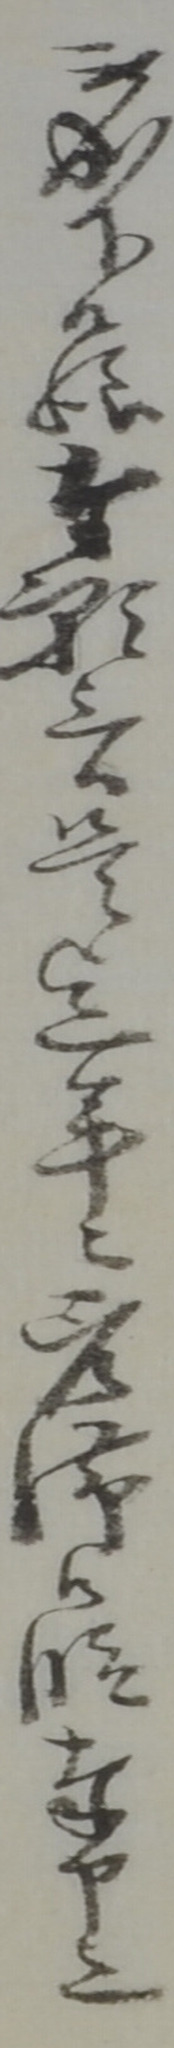被成下候様奉願上候是迄年々差滞候段奉申上
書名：諸願書控帳
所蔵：伊那市立高遠町図書館・合同会社AMANE
